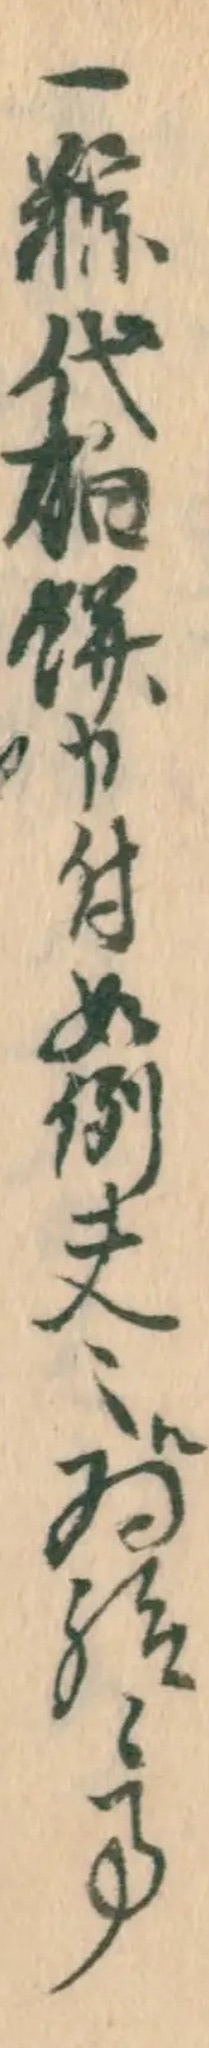一粽代柏餅申付如例夫々え為給候事
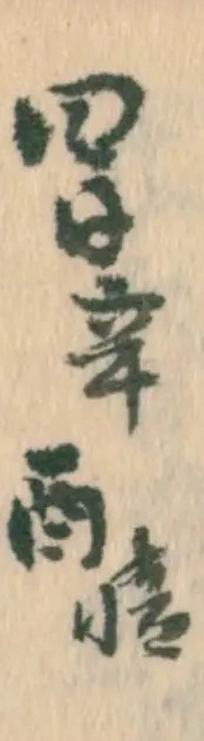四日辛酉晴
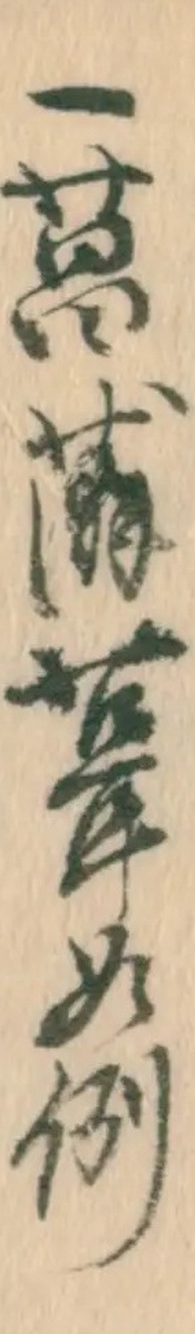一菖蒲葺如例
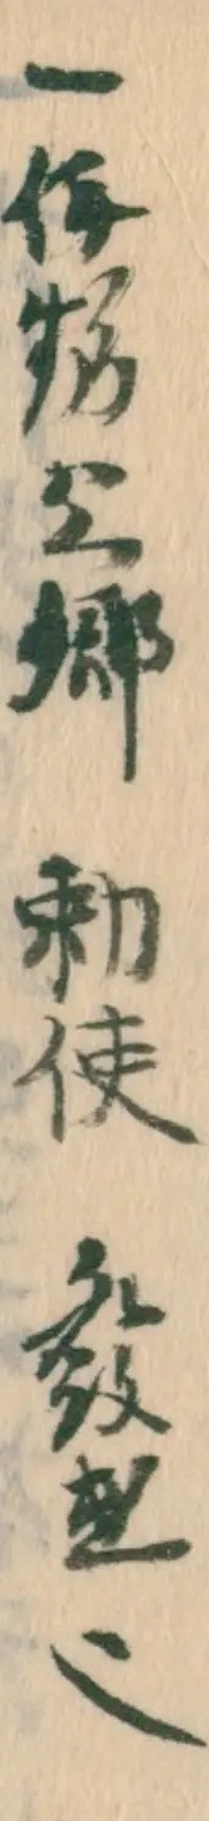一伊勢公卿勅使発遣也
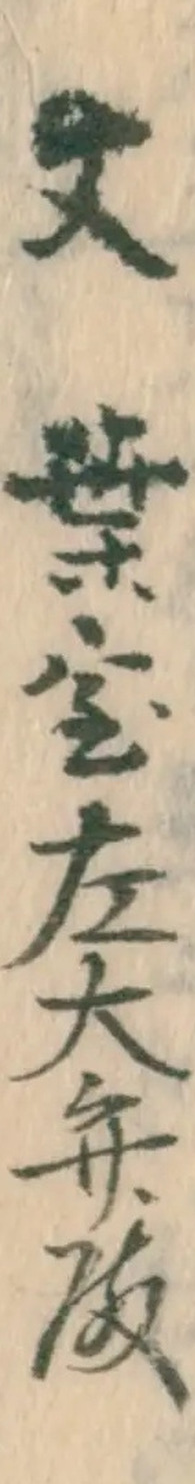丈葉室左大弁殿
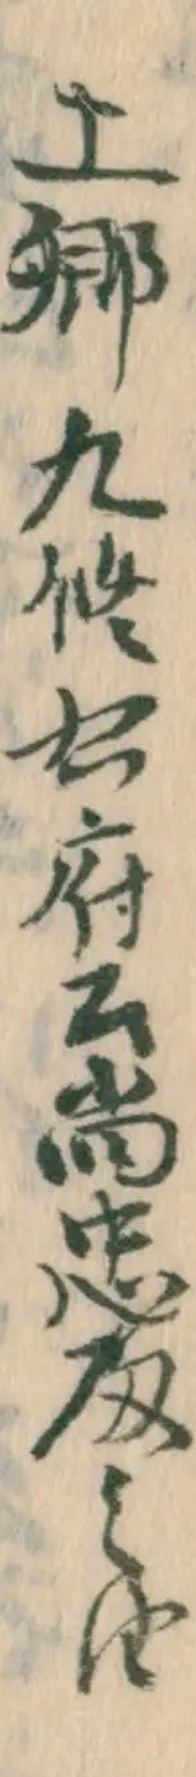上卿九条右府公尚忠殿之由
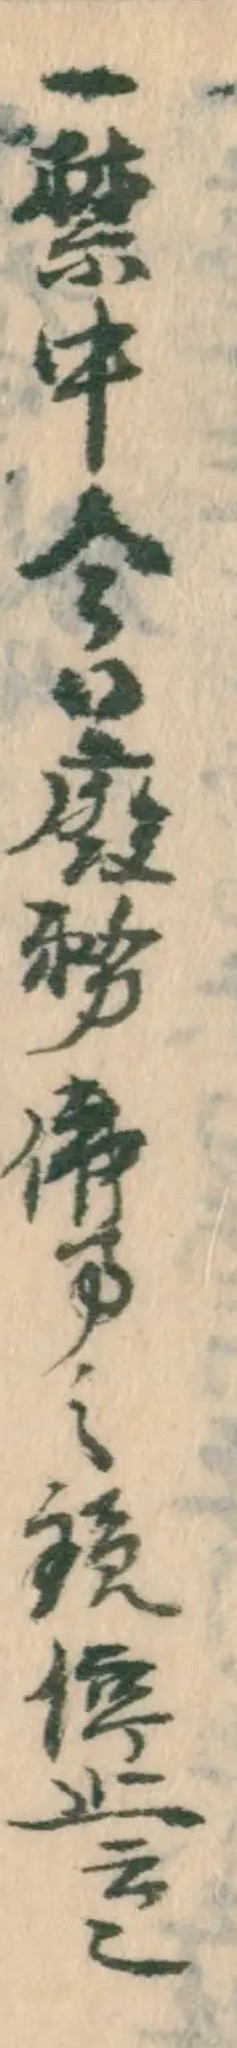一禁中今日廃務仏事之鏡停止云々
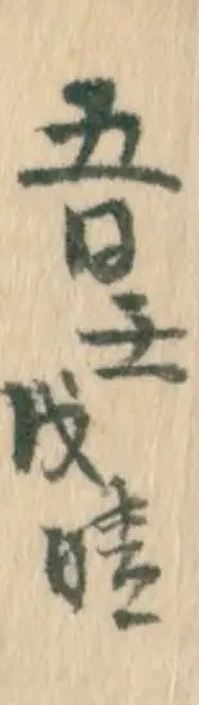五日壬戌晴
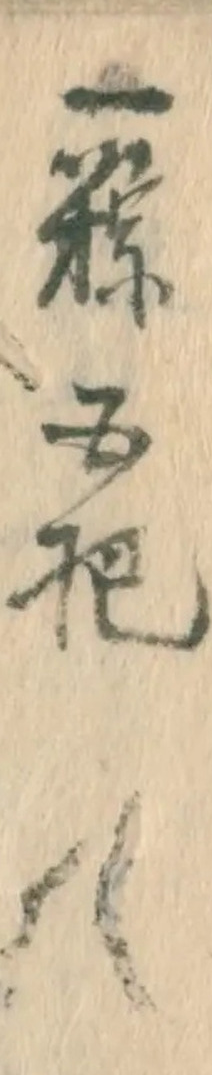一粽五把
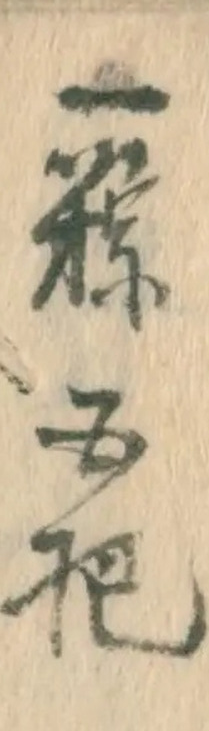一粽五把
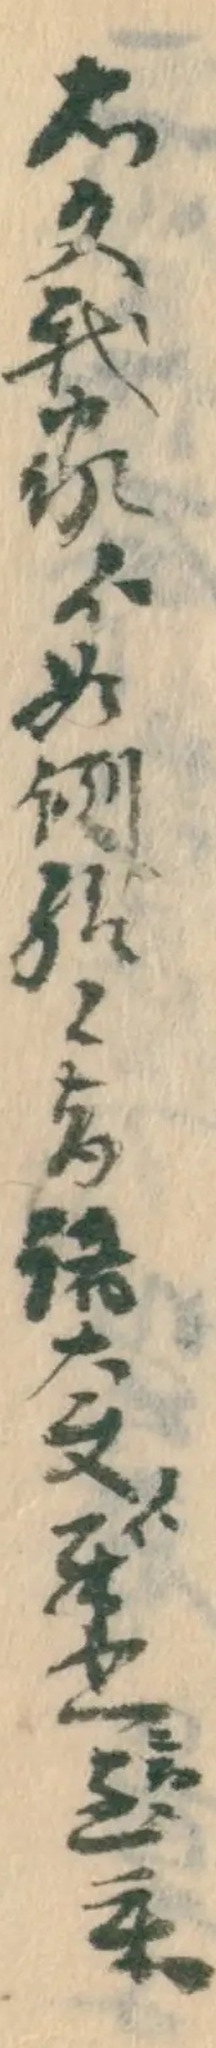右久我家ゟ如例給候旨諸大夫ゟ来書ニ而到来
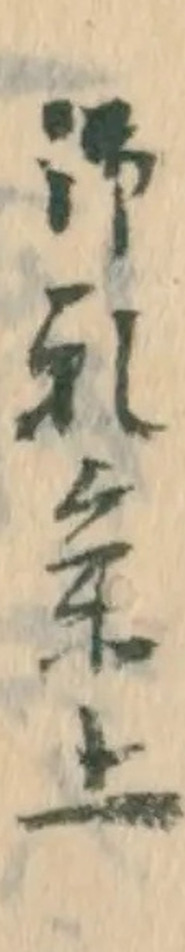御礼参上

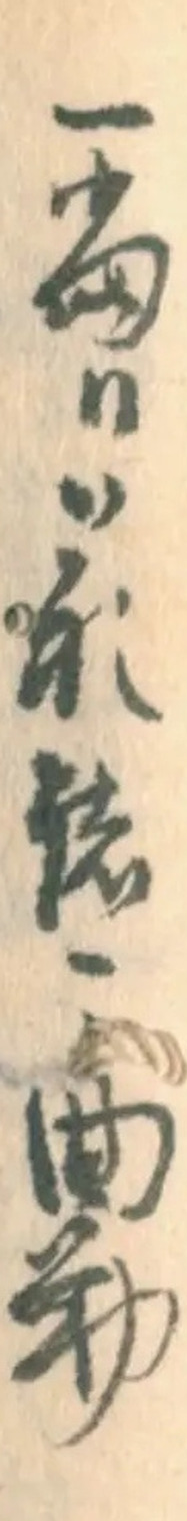一当日御礼諸々回勤
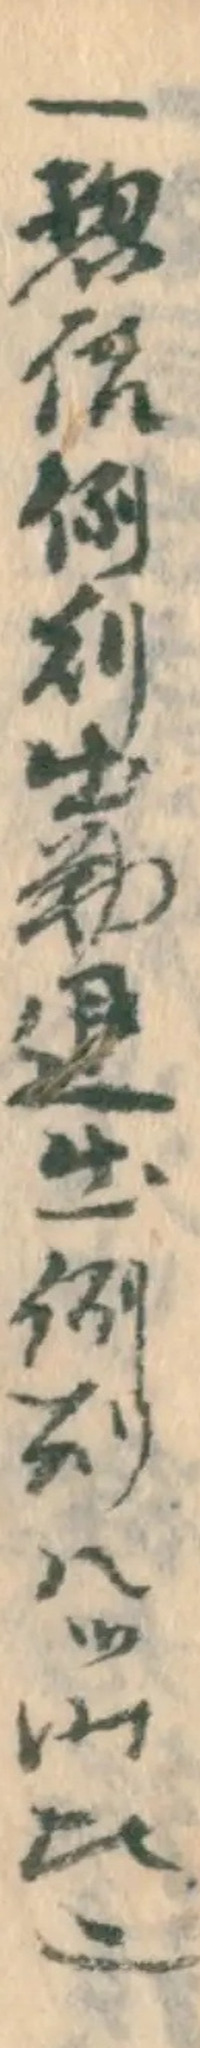一惣例刻出勤退出例刻八ツ時頃也
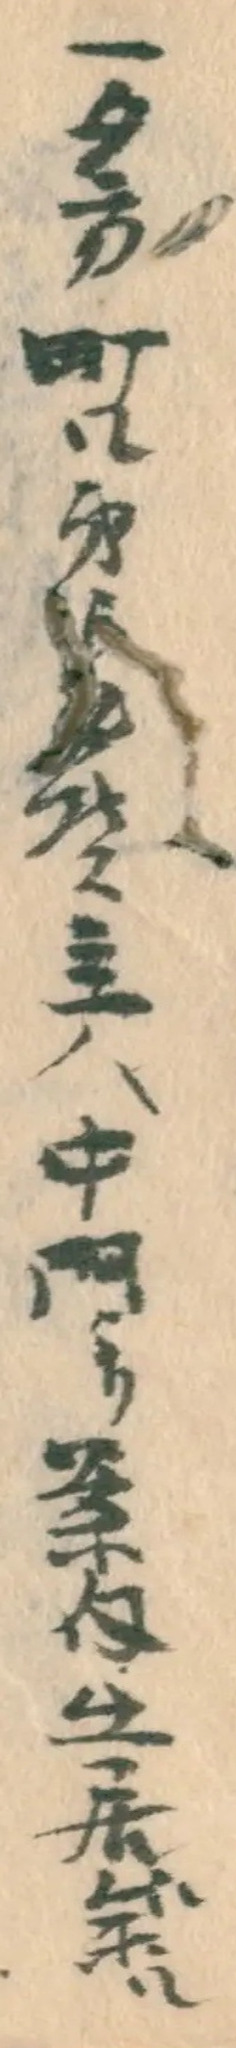夕方町口第え罷越ス主人中門より案内出居参ル
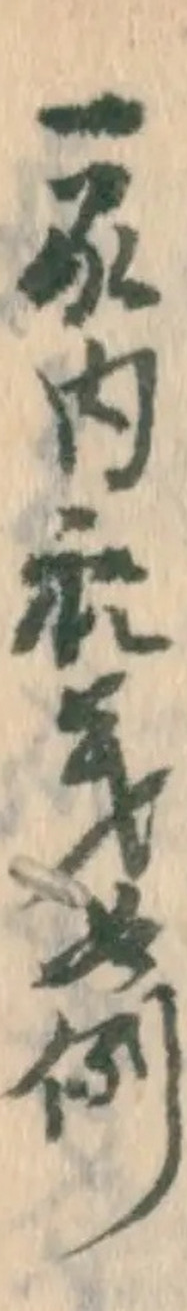一家内祝義如例
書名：禁裏御所御用日記. [131]
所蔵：国立国会図書館 National Diet Library, JAPAN
